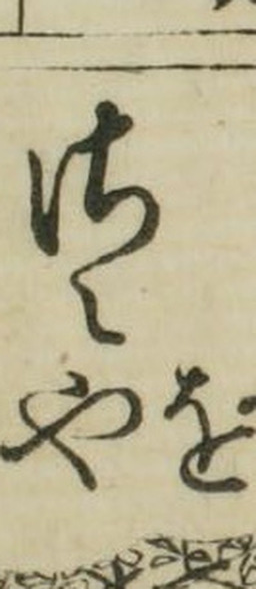さえや
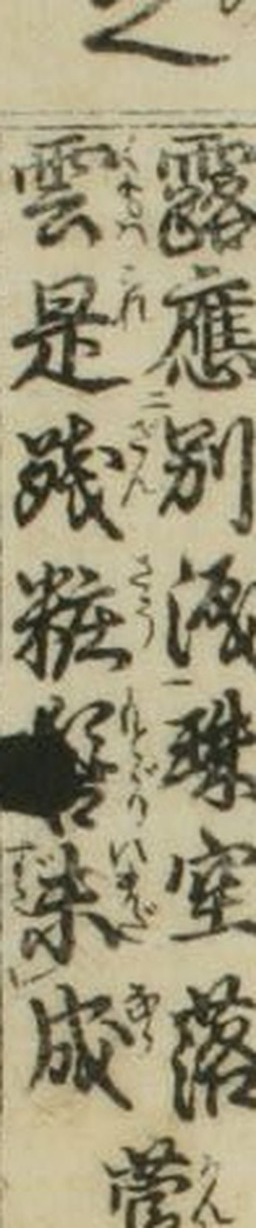雲是残粧髻未成詩
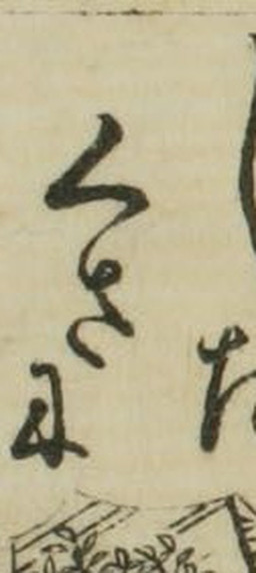くさに
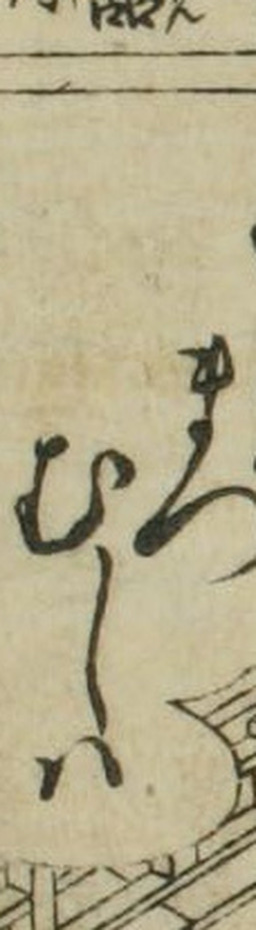むしは
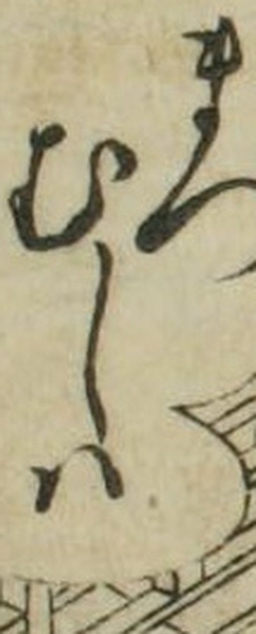むしは
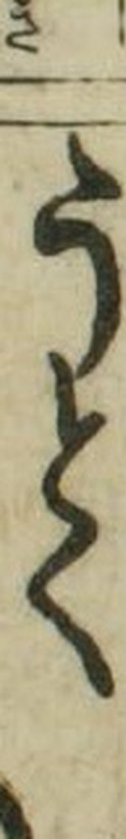うとく
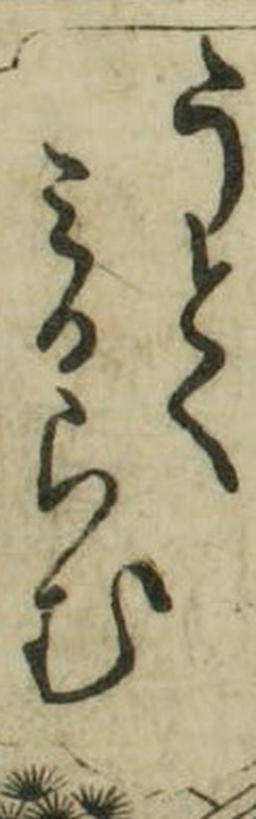みるらむ

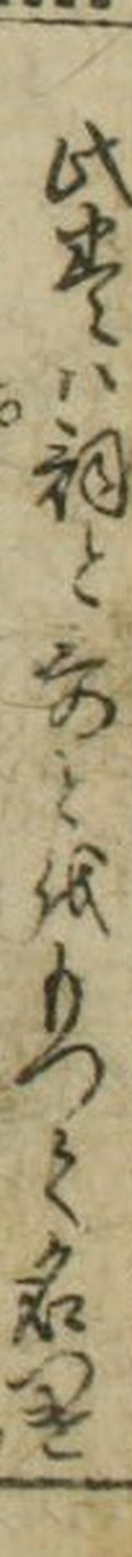此巻は詞と哥とをもつて名つけ
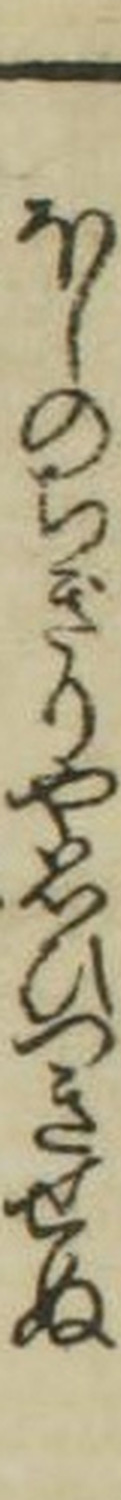ほしのちぎりや思ひつきせぬ
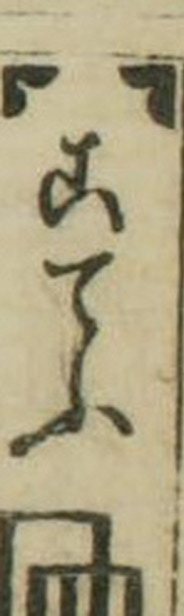こてふ
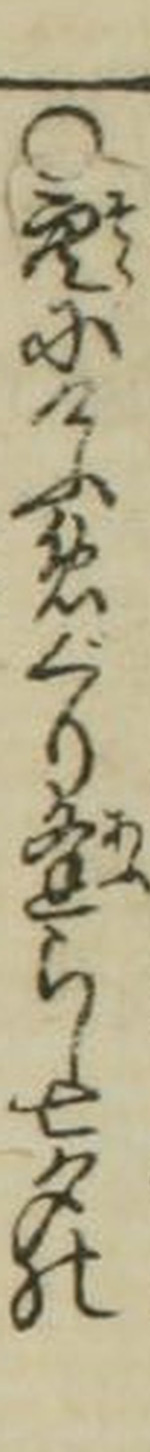○空にけふめぐり逢らし七夕の道晃
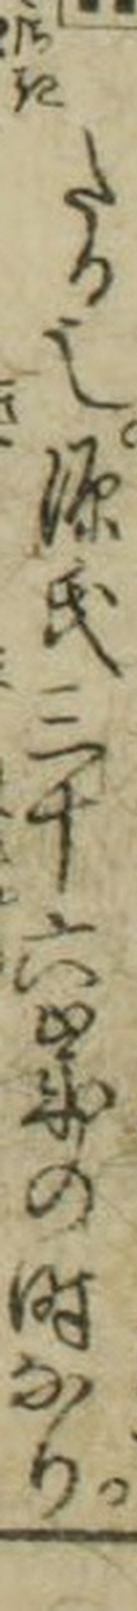たる也。源氏三十六歳の時なり。
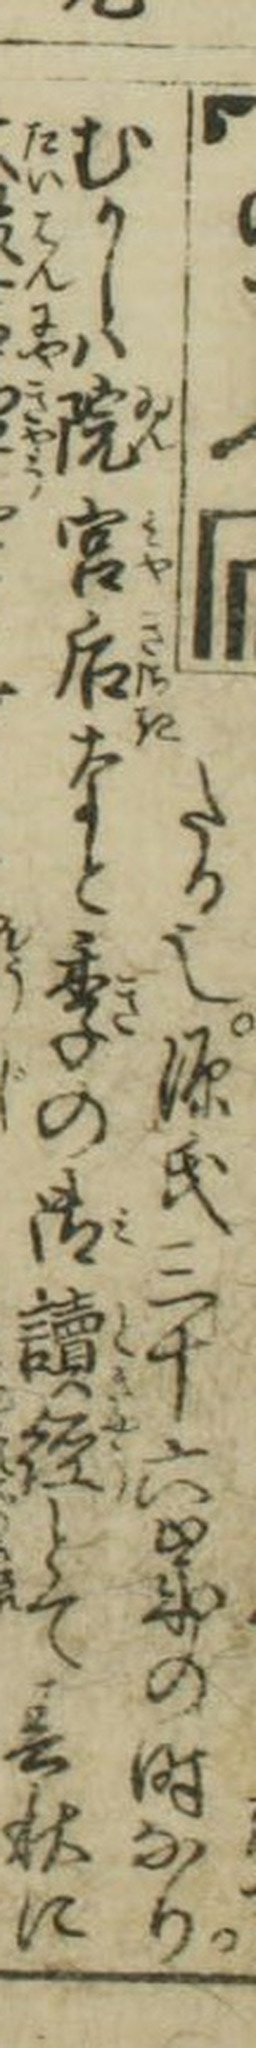むかしは院宮后なと季の御読経とて春秋に
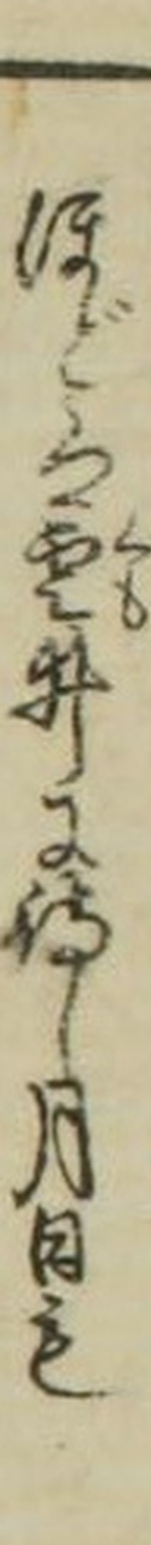ほどは雲ゐに待し月日も
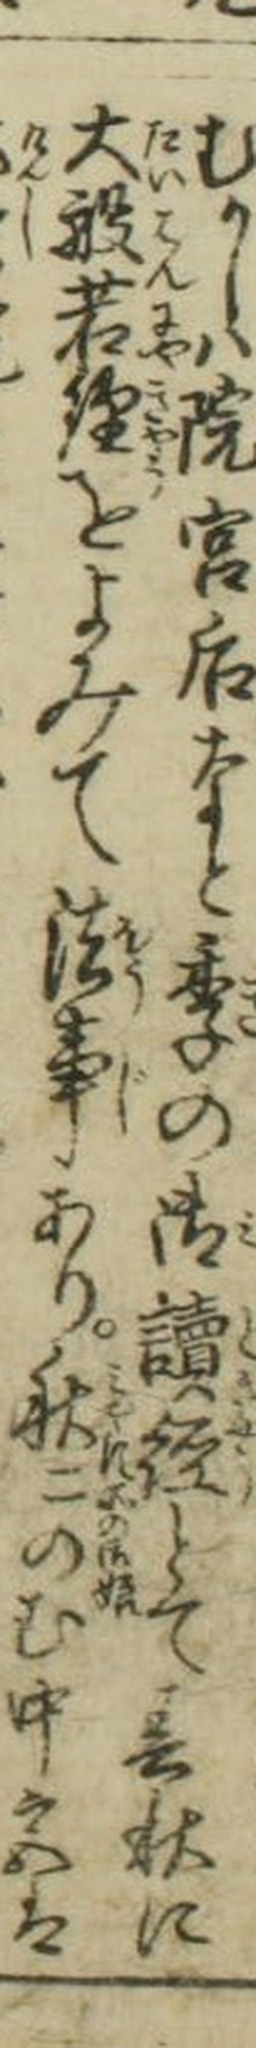大般若経をよみて法事あり。秋このむ中宮は
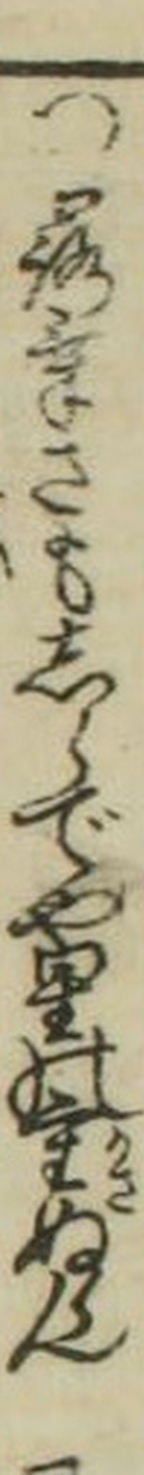○露けさもしらでや里の重ぬらん通茂
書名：女源氏教訓鑑
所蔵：東京学芸大学附属図書館
